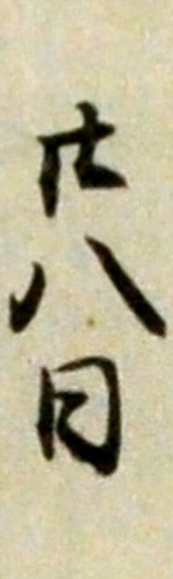廿八日
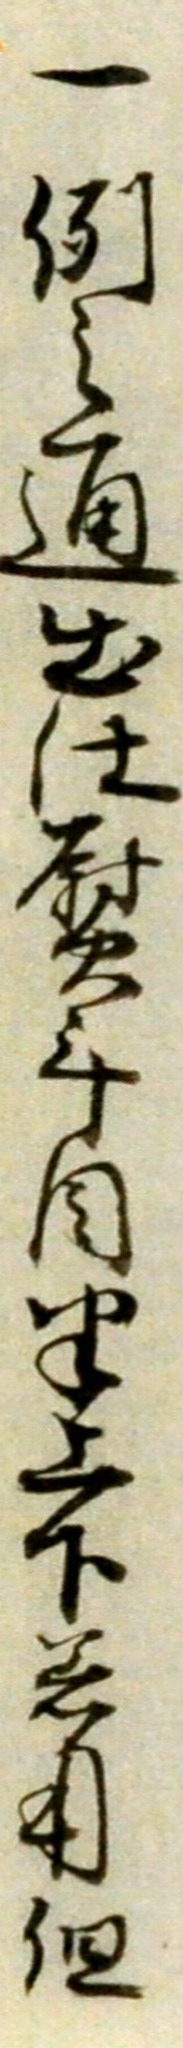一例之通出仕熨斗目半上下着用但
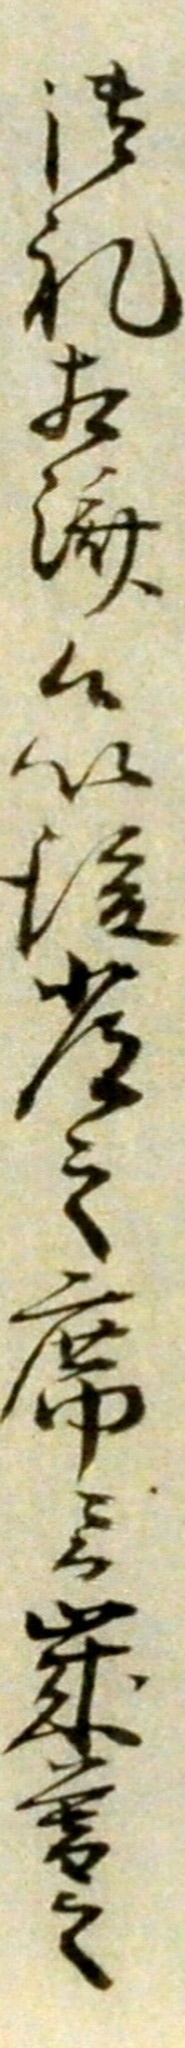御礼相済候以後常之席にて歳暮之
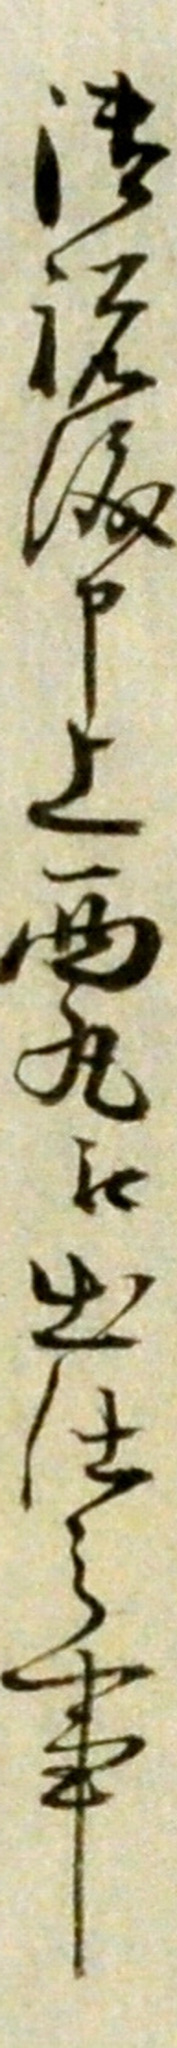御祝儀申上西丸え出仕之事
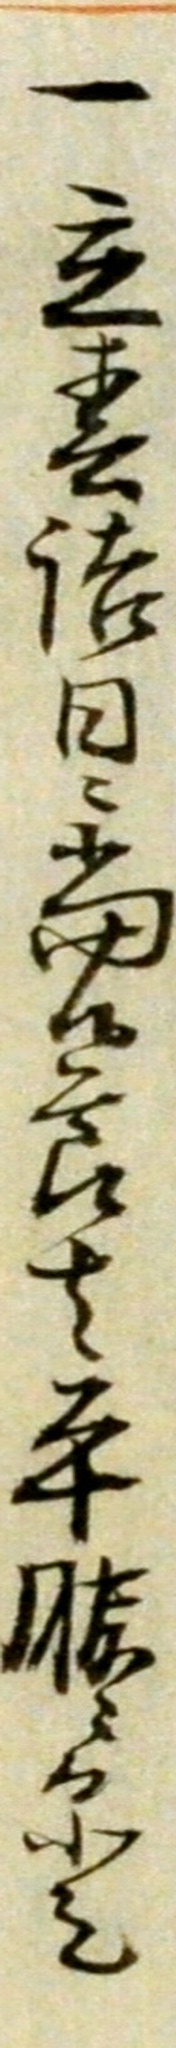一立春詰日に当候節は平伏にて登
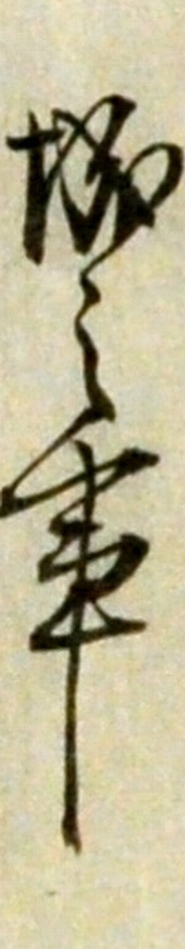城之事
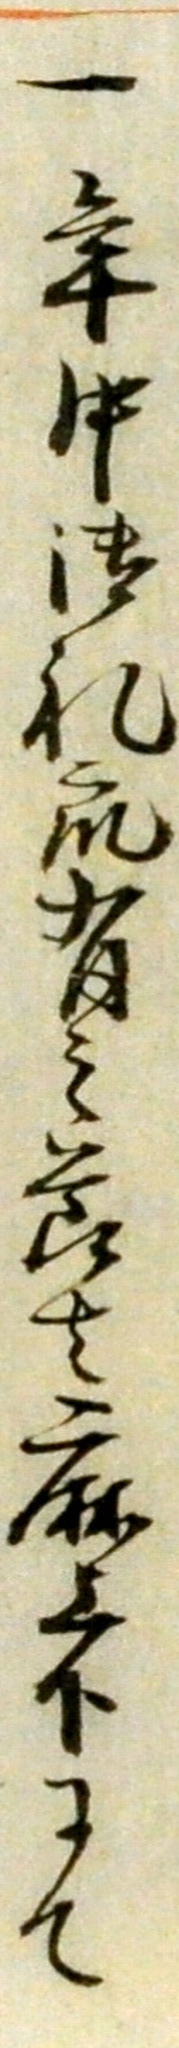一年中御礼衆有之節は麻上下にて
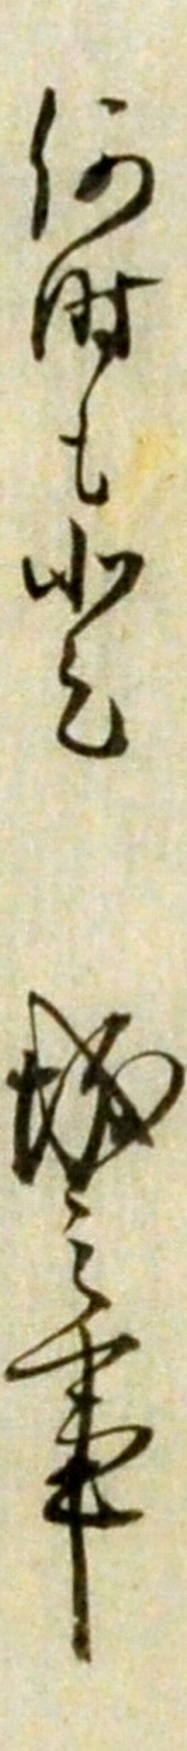何時も登城之事
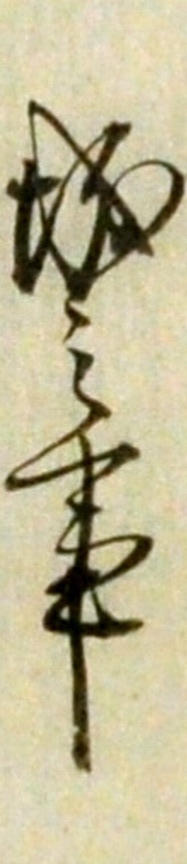城之事
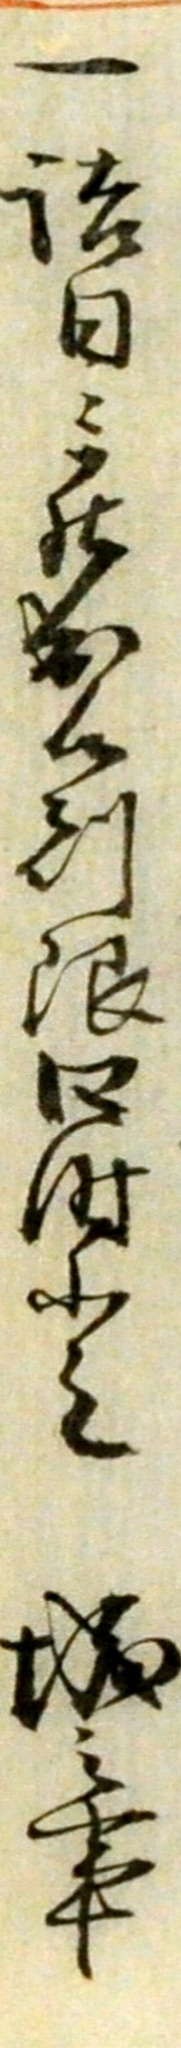一詰日に罷出候刻限四時登城之事
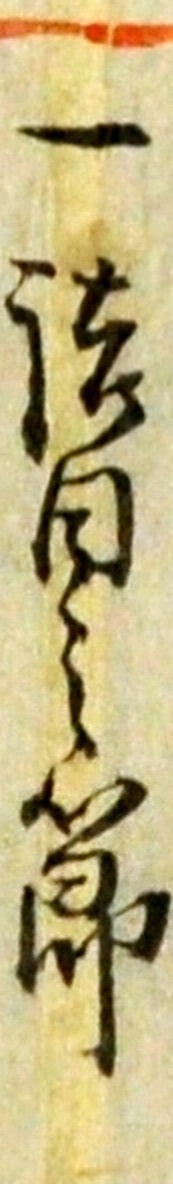一詰日之節
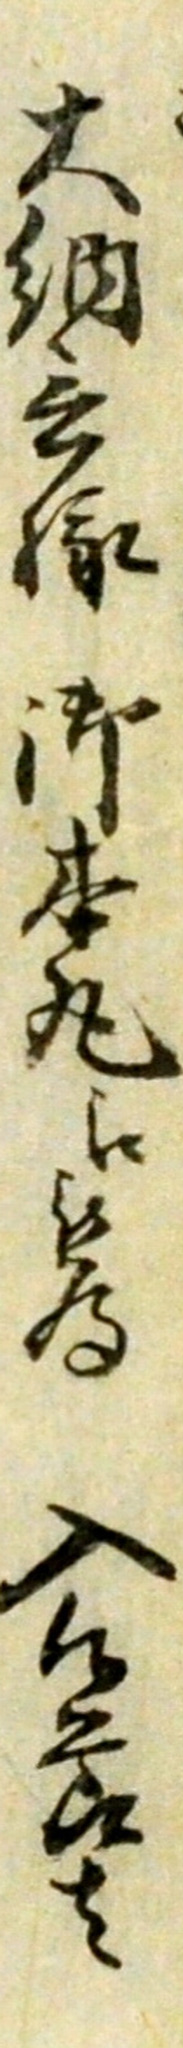大納言様御本丸え被為入候節は
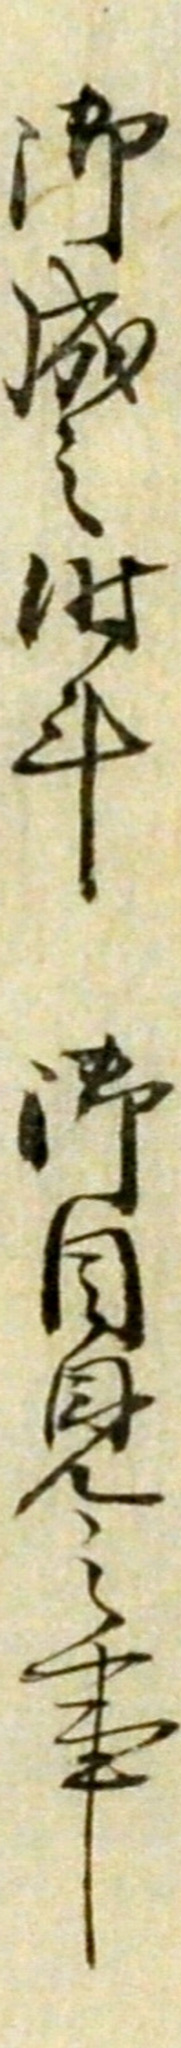御成之時斗御目見之事
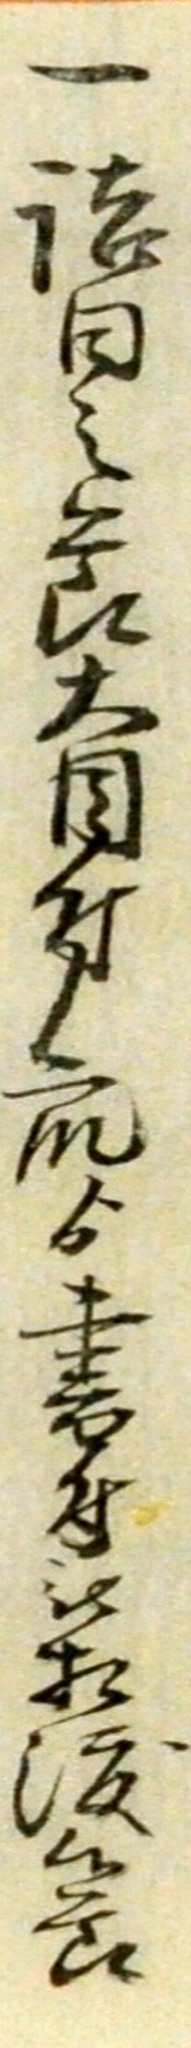一詰日之節大目付衆ゟ書付被相渡候節
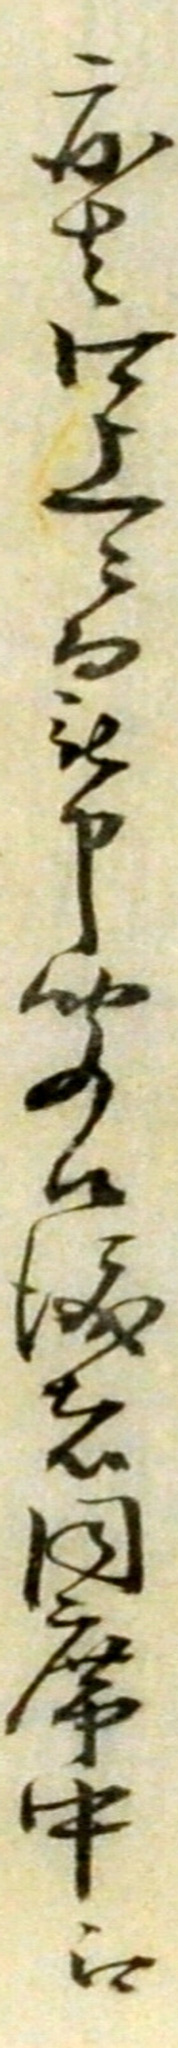亦は口上にて被申聞候儀は同席中え
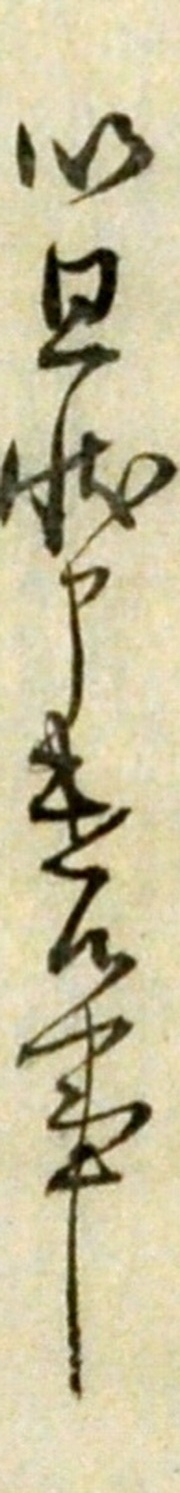以廻状申遣候事
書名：申合帳〔一括〕
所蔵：伊那市立高遠町図書館・合同会社AMANE
